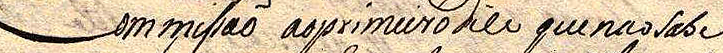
Commissaõ ao primeiro dice que nao sabe
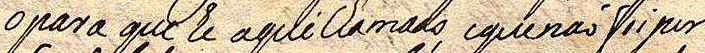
o para que he aqui chamado, e que naõ foi per
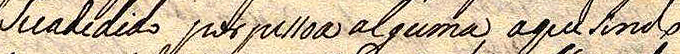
suadedido por pessoa alguma, a que sendo
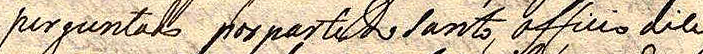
perguntado por parte do santo officio dice
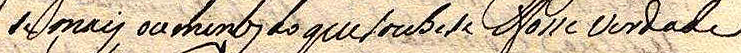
se mais, ou menos do que soubese fosse verdade
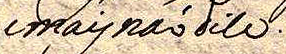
e mais naõ dice.
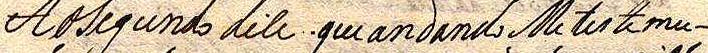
Ao Segundo dice que andando elle testemu
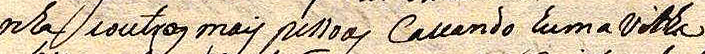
nha e outras mais pessoas cauando huma villa
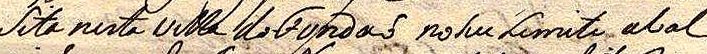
sita nesta villa do Fundaõ no seu Limite a tal
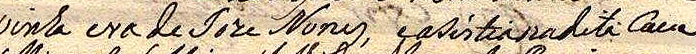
vinha era de Joze Nunes, e asistia na dita Caua
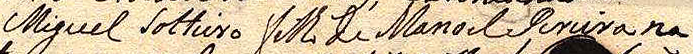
Miguel solteiro filho de Manoel Pereira na
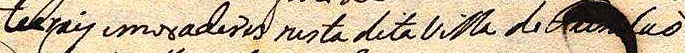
turais e moradores nesta dita Villa do Fundaõ
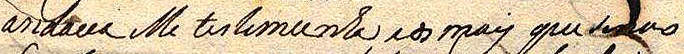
andaua elle testemunha, e os mais que se _aõ
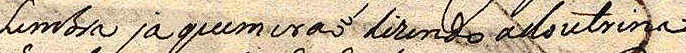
Lembra ja quem eraõ dizendo a doutrina
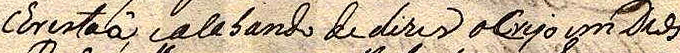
christaã, e acabando de dizer o Crejo em Deos
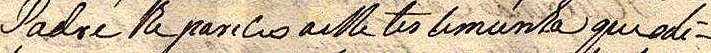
Padre lhe pareCeo a elle testemunha que o di
